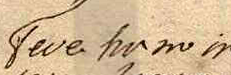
Teve hum in
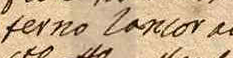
terno Rancor ao
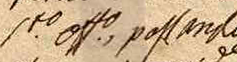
st.o Off.o, passando
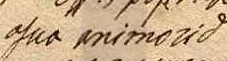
a sua animozid.e
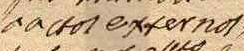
a actos externos;
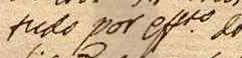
tudo por eff.to da
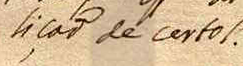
liçaõ de certo s.o
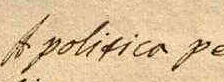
A politica pe
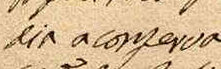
dia a conserva
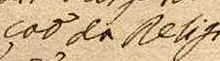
çaõ da Religi
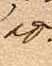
aõ.
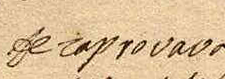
fe Raprovava
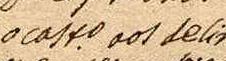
o cast.o aos delin
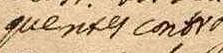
quentes contra
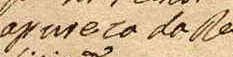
a pureza da Re
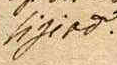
ligiaõ.
